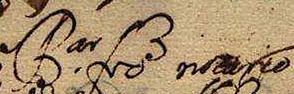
B.ar frz̄ notario
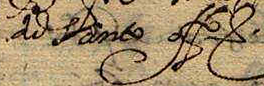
do santo offo
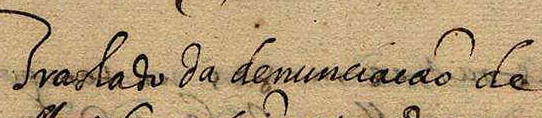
Traslado da denunciaçaõ de
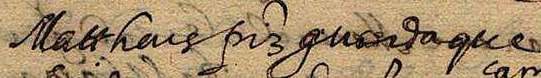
Mattheus piz̄ guarda que
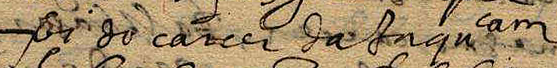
foi do carcer da Jnquçam
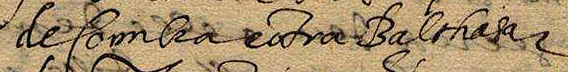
de Coimbra cōtra Balthasar
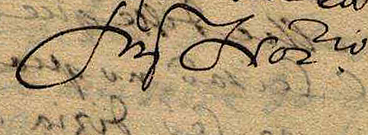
frz̄ Notrio
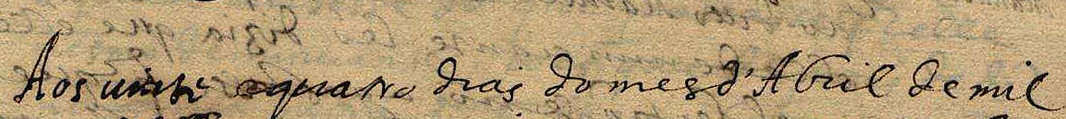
Aos uinte E quatro dias do mes d'Abril de mil
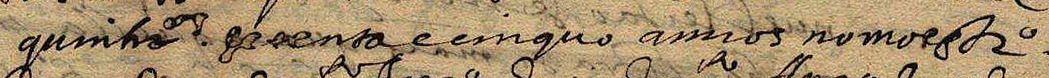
quinhtos. setenta e cinquo annos no moestro
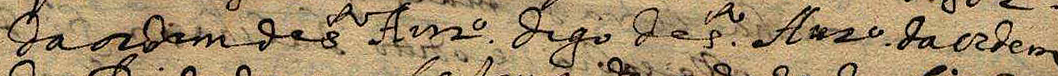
da ordem de s.to Anto. digo de sto. Anto. da ordem
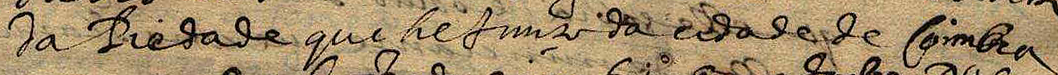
da Piedade que he Iunto da cidade de Coimbra
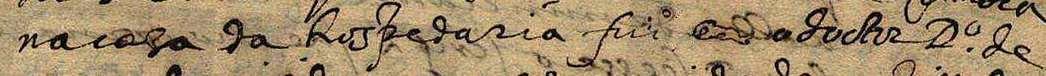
na casa da hospedaria fui _ o doctor Do. de
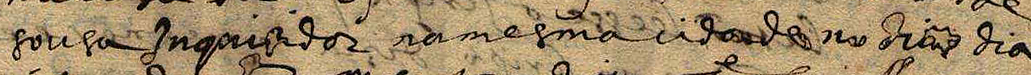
sousa Jnquisidor na mesma cidade no ditto dia
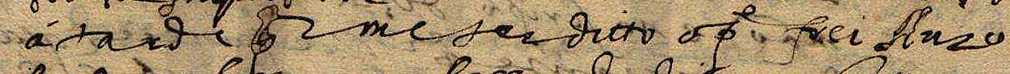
á tarde p̄o me ter ditto o pe frei Anto
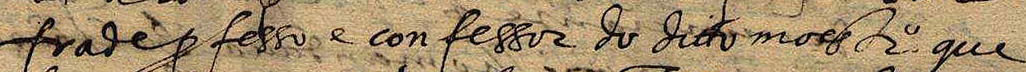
frade ꝓfesso e confessor do ditto moestro que
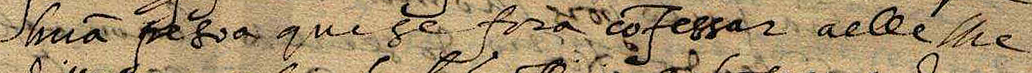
huā pesoa que se fora cōfessar a elle lhe
